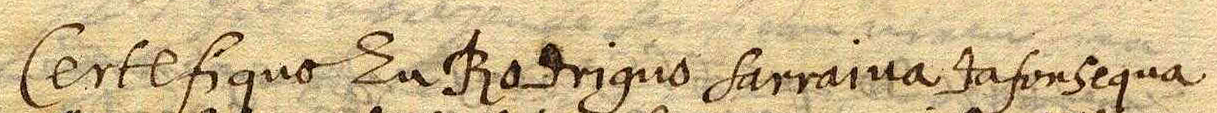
Certefiquo Eu Rodriguo sarraiua da fonsequa
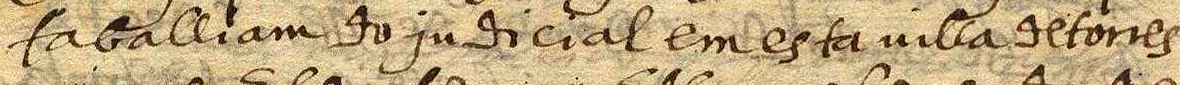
taballiam do judicial em esta uilla de torres
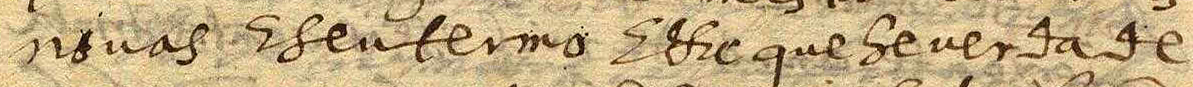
nouas E seu termo E &c que he uerdade
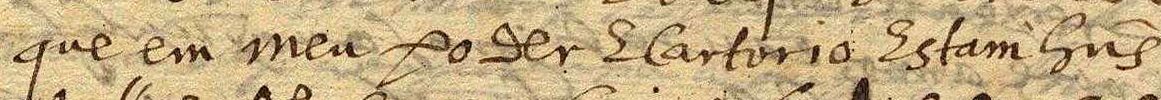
que em meu poder E Cartorio Estam hūs
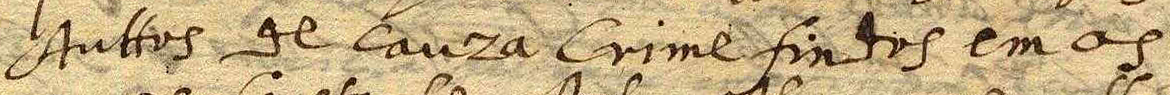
Auttos de cauza Crime findos em os
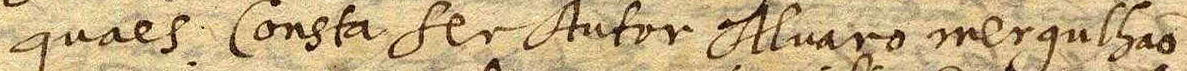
quaes Consta ser Autor Aluaro mergulhaõ
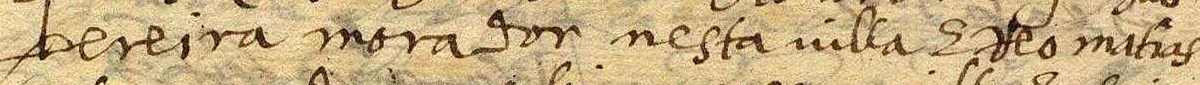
pereira morador nesta uilla E Reo matias
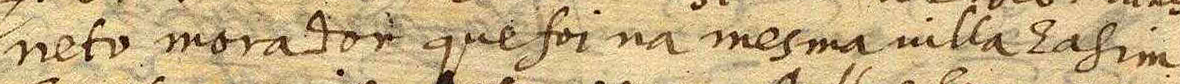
neto morador que foi na mesma uilla E asim
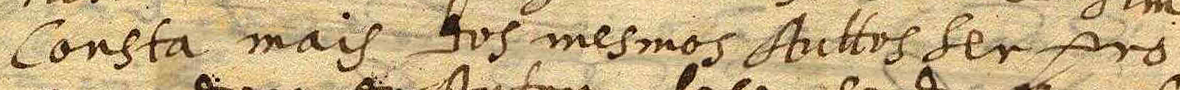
Consta mais dos mesmos Auttos ser pro
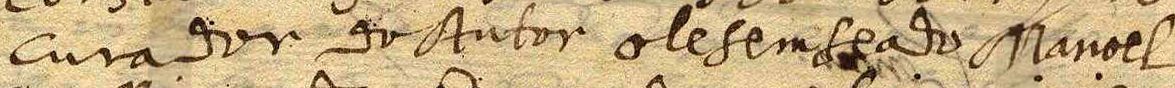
curador do Autor o lesemseado Manoel
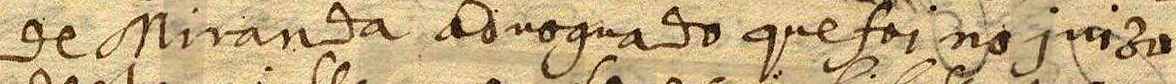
de Miranda aduoguado que foi no juizo
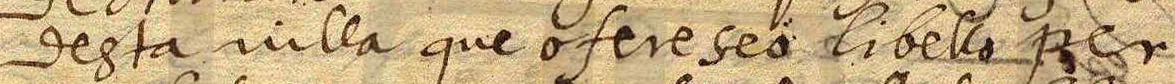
desta uilla que ofereseo libello per
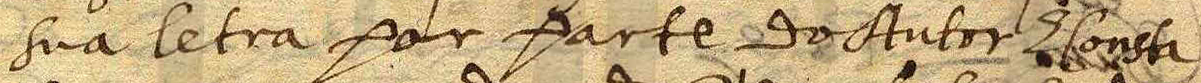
sua letra por parte do Autor E Consta
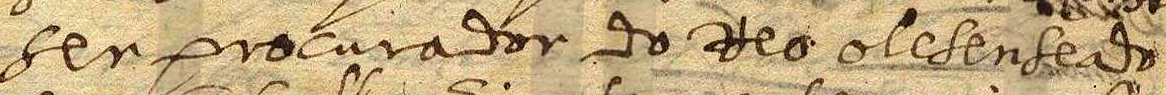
ser procurador do Reo o lesenseado
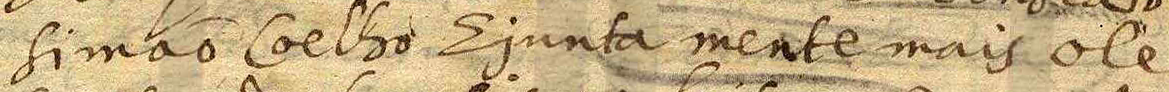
simão Coelho E juntamente mais o le
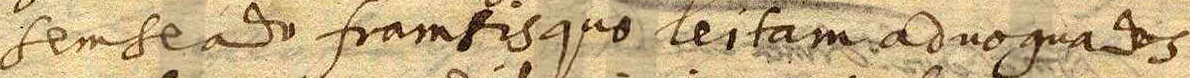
semseado framsisquo leitam aduoguados
